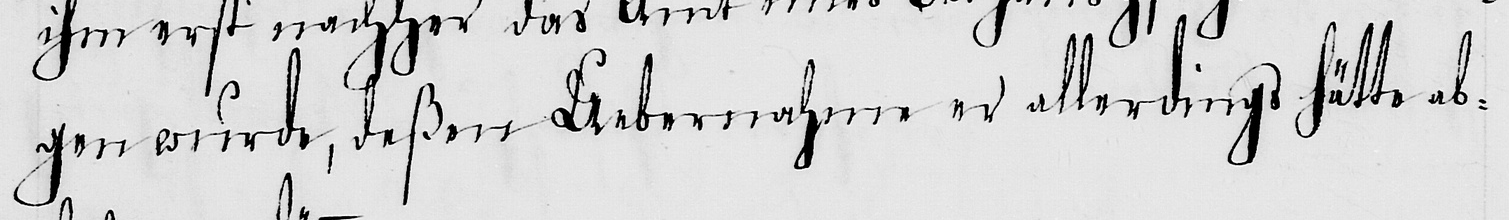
gen wurde, deßen Uebernahme er allerdings hätte ab¬
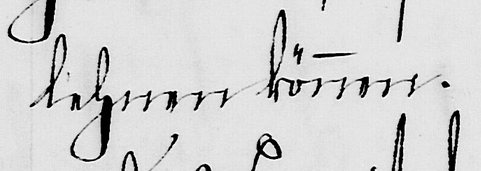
lehnen können.
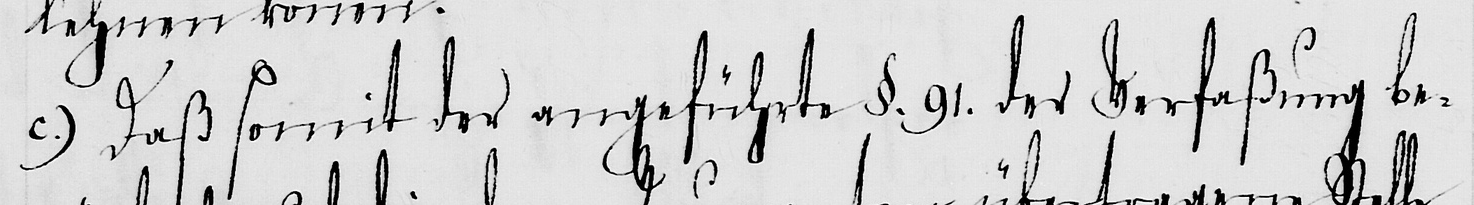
c.) Daß somit der angeführte §. 91. der Verfaßung be¬
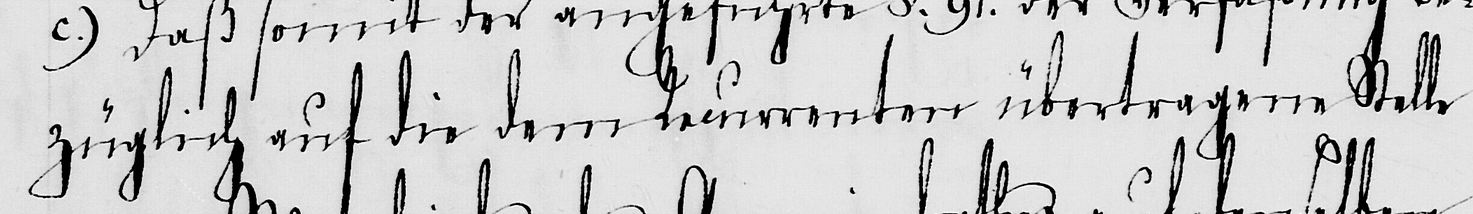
züglich auf die dem Recurrenten übertragene Stelle
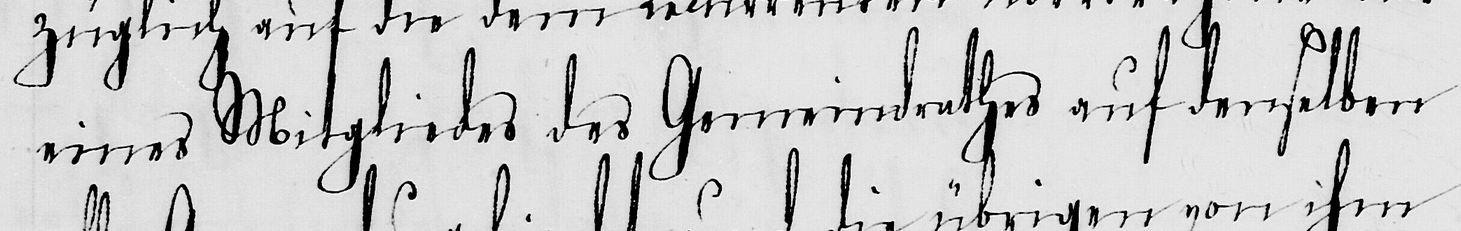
eines Mitgliedes des Gemeindrathes auf denselben
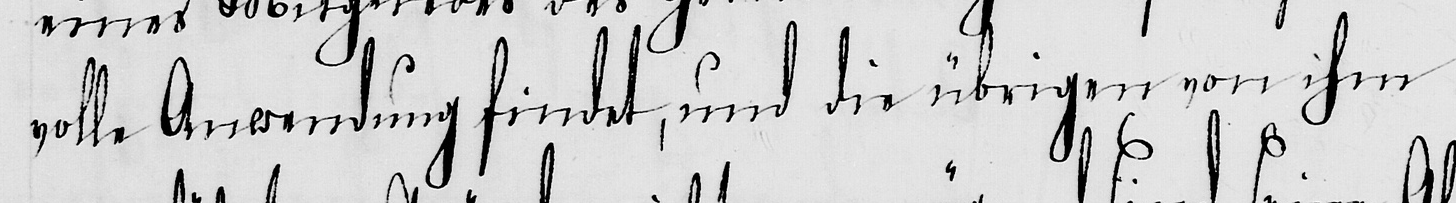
volle Anwendung findet, und die übrigen von ihm
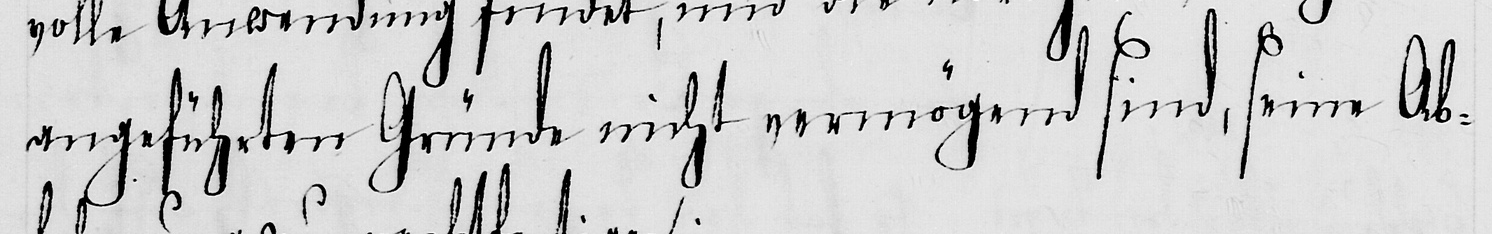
angeführten Gründe nicht vermögend sind, seine Ab¬
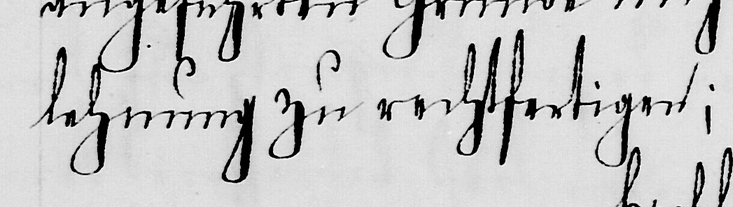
lehnung zu rechtfertigen;
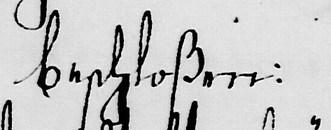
beschloßen:
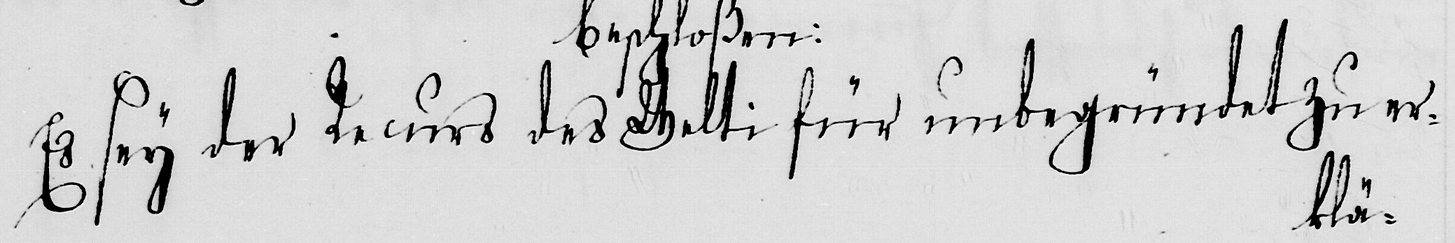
Es sey der Recurs des Welti für unbegründet zu er-
